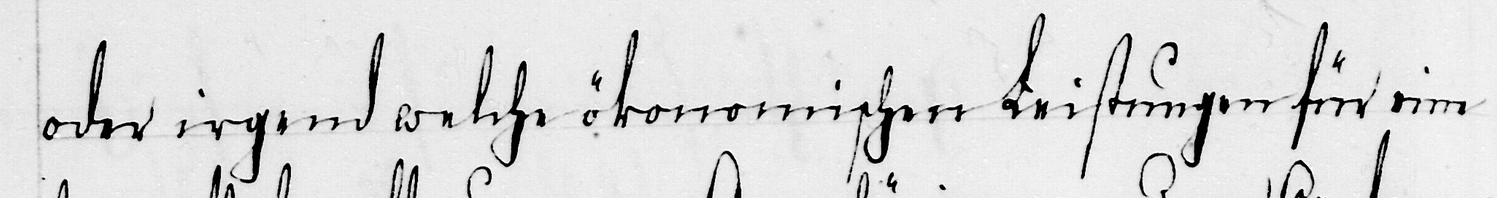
oder irgend welche ökonomischen Leistungen für eine
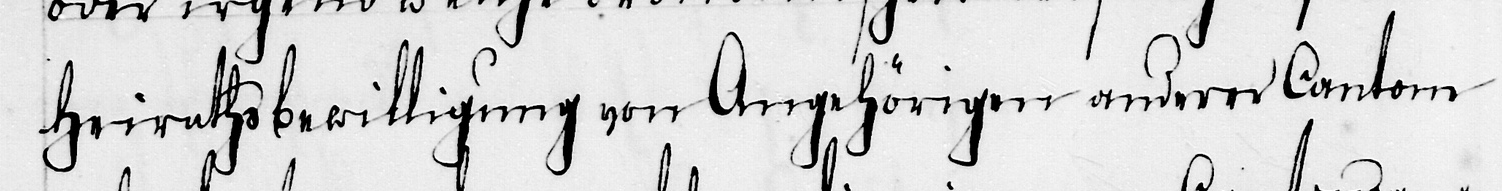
Heirathsbewilligung von Angehörigen anderer Cantone
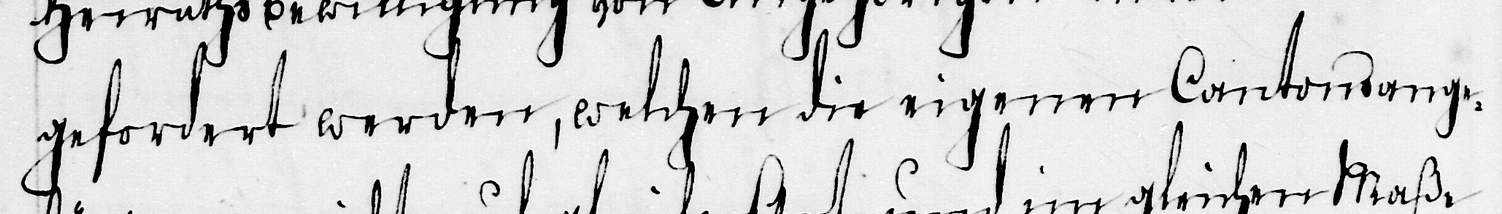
gefordert werden, welchen die eigenen Cantonsange¬
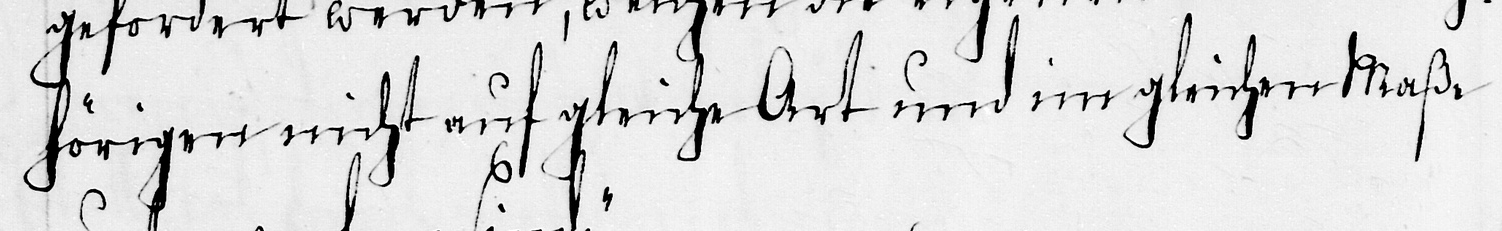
hörigen nicht auf gleiche Art und im gleichen Maße
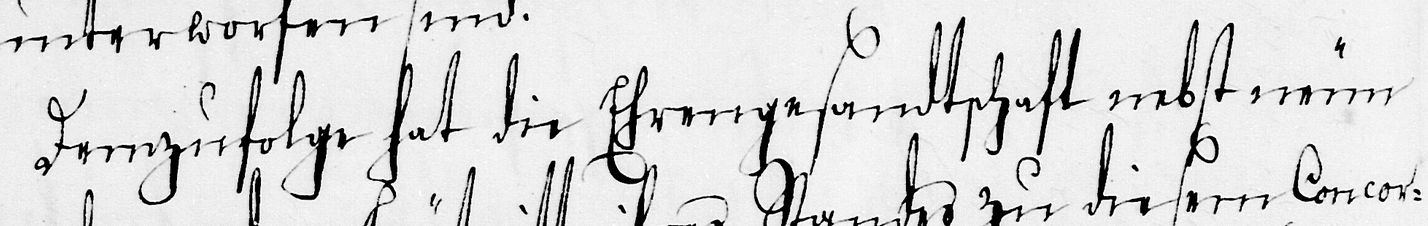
Demzufolge hat die Ehrengesandtschaft nebst neun
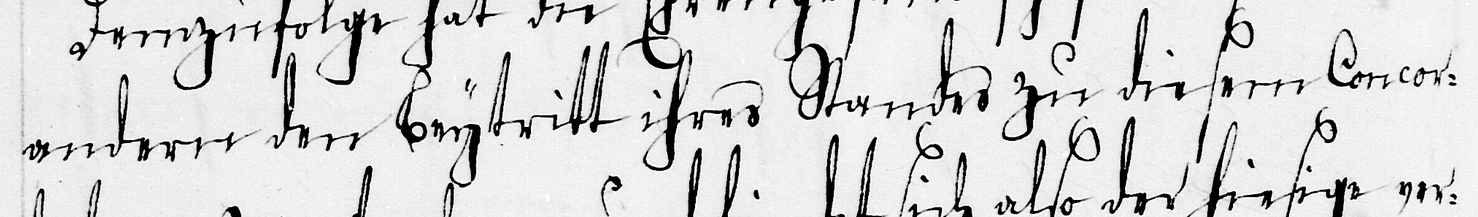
andern den Beytritt ihres Standes zu diesem Concor¬
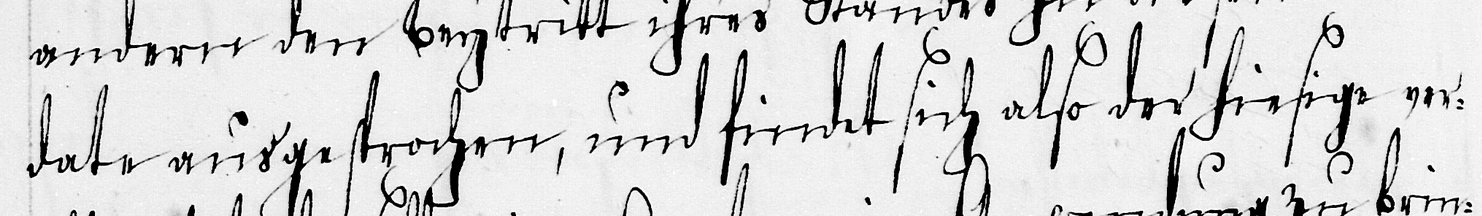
date ausgesprochen, und findet sich also der hiesige v¬
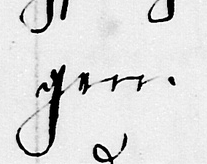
gen.
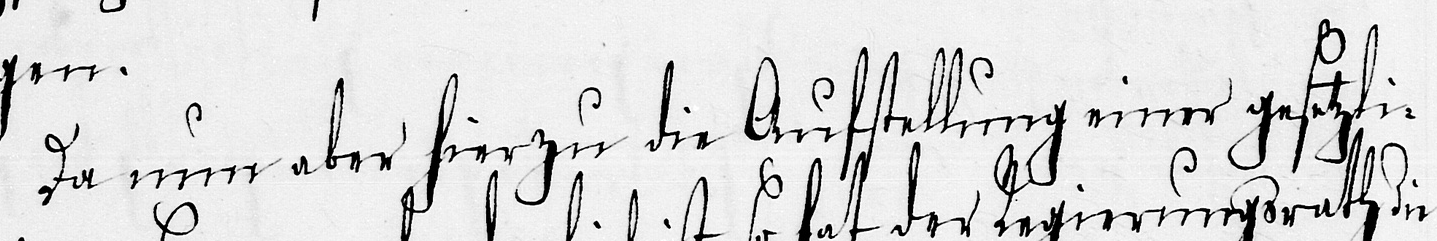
Da nun aber hierzu die Aufstellung einer gesetzl¬
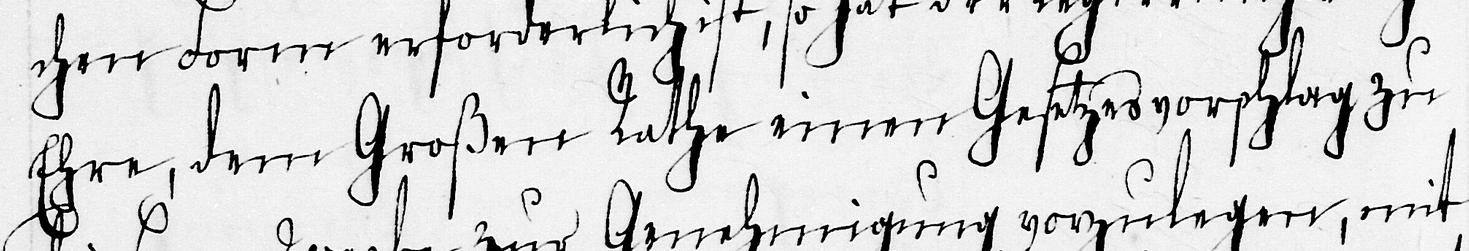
Ehre, dem Großen Rathe einen Gesetzesvorschlag zu
